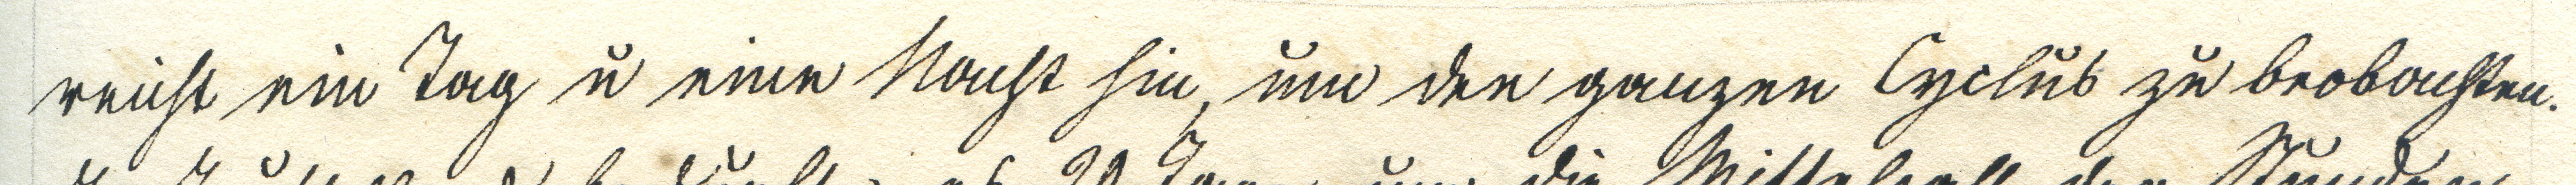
reicht ein Tag u eine Nacht hin, um den ganzen Cyclus zu beobachten.
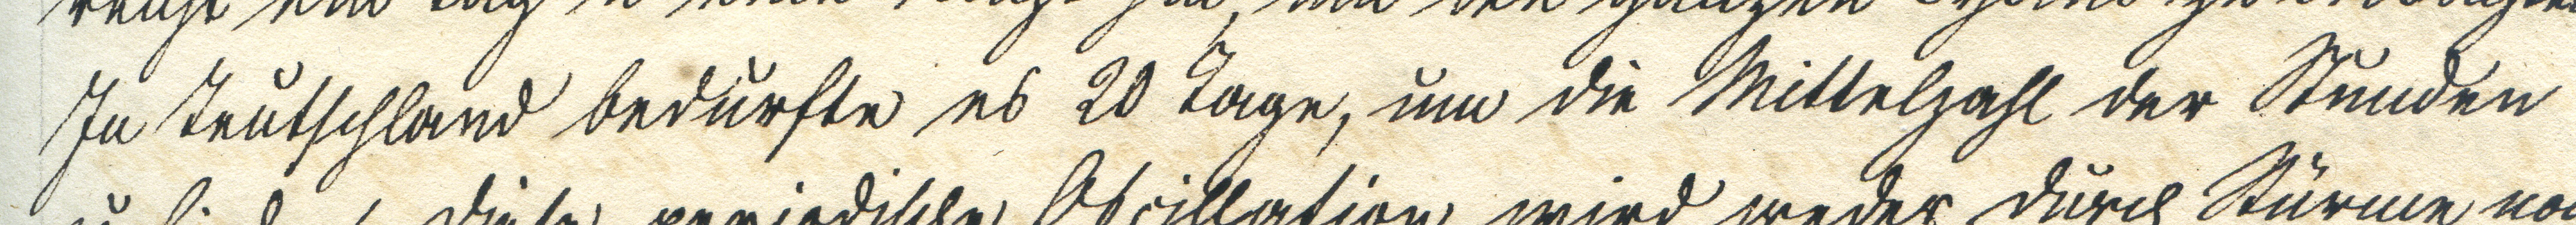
In Teutschland bedurfte es 20 Tage, um die Mittelzahl der Stunden
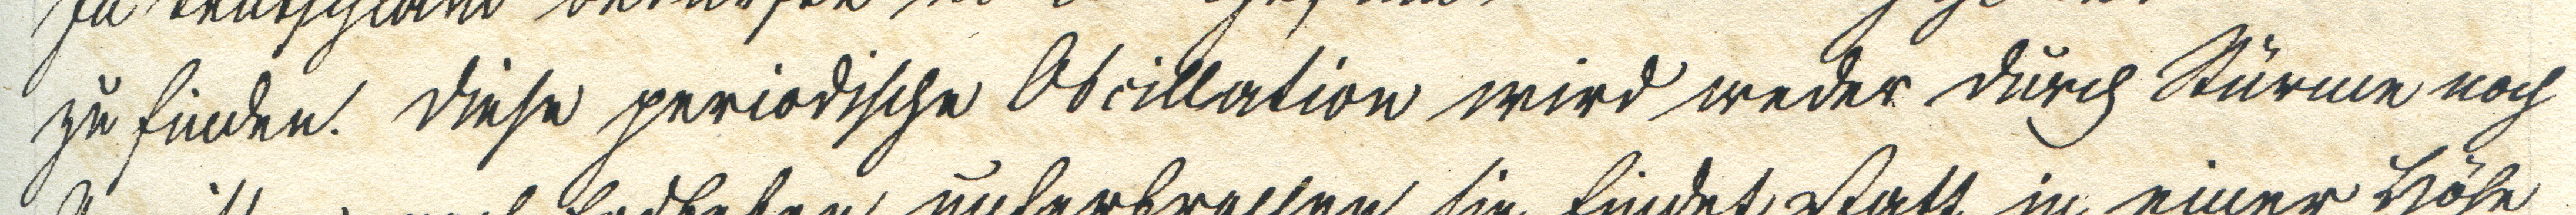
zu finden. Diese periodische Oscillation wird weder durch Stürme noch
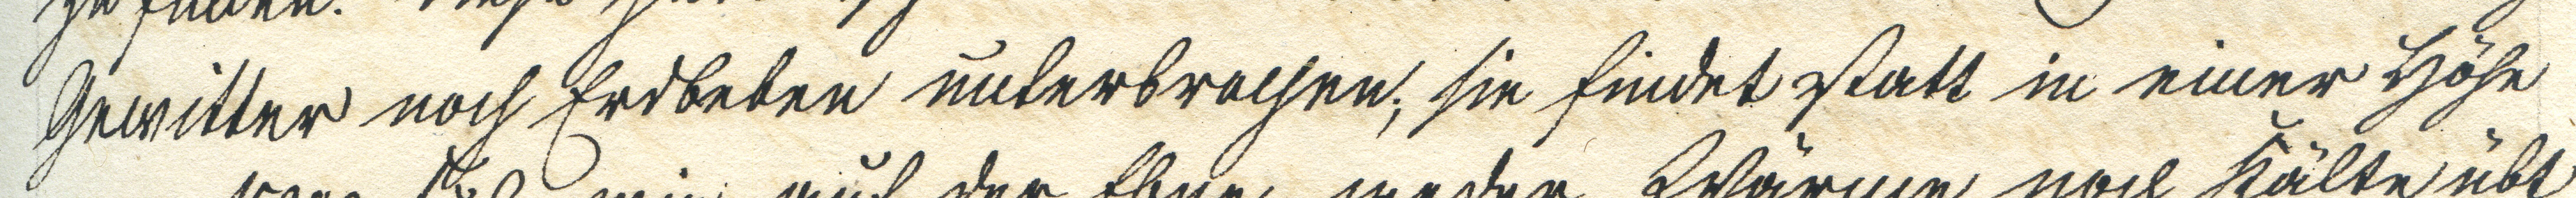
Gewitter noch Erdbeben unterbrochen; sie findet statt in einer Höhe
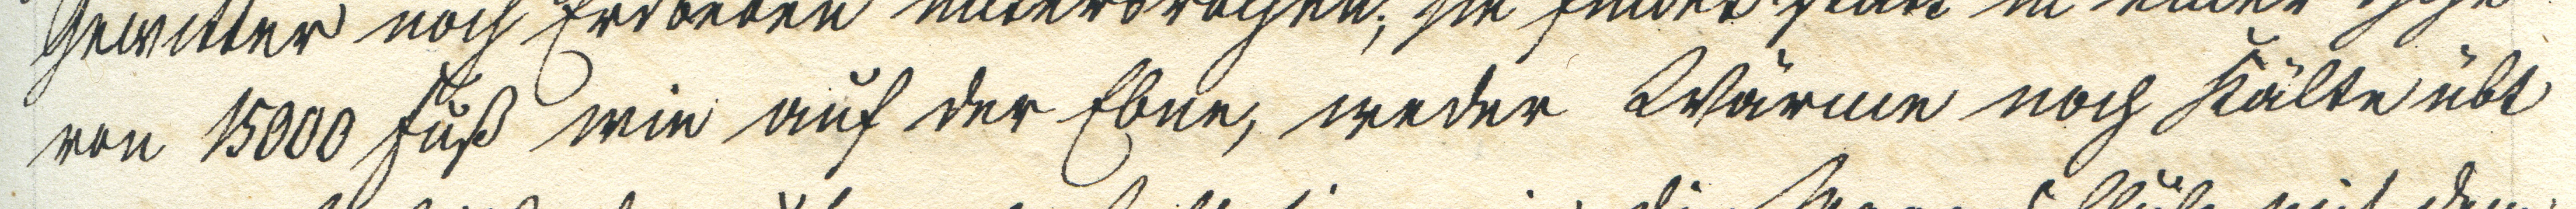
von 15000 Fuß wie auf der Ebne, weder Wärme noch Kälte übt
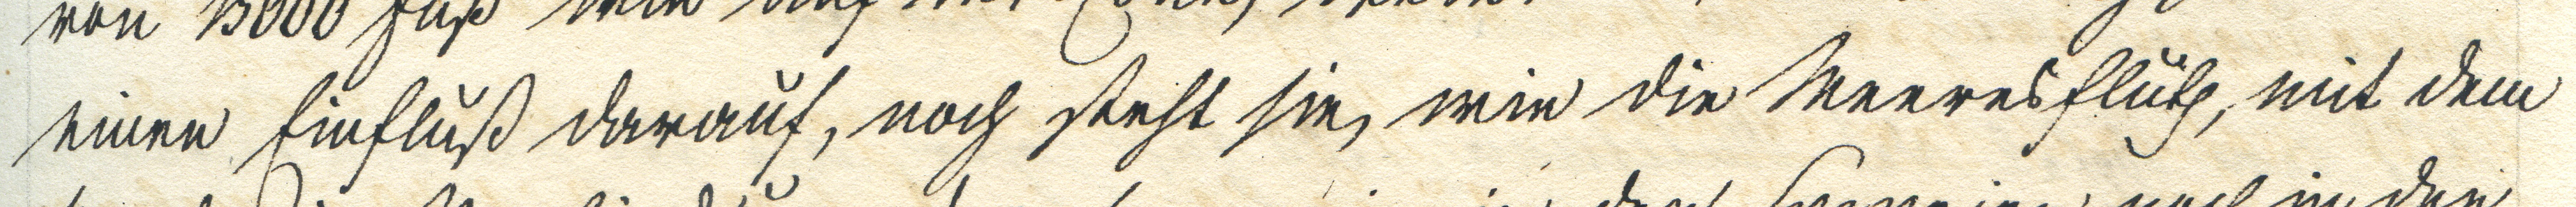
einen Einfluß darauf, noch steht sie, wie die Meeresfluth, mit dem
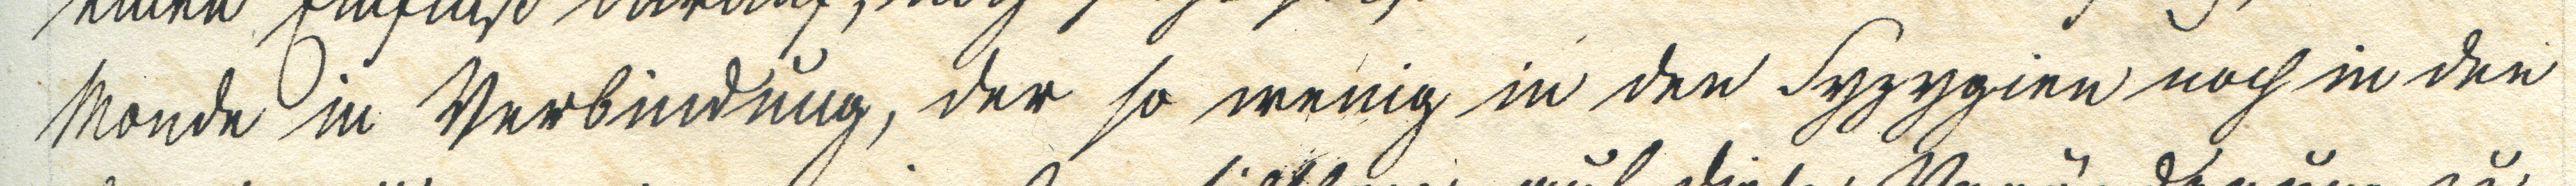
Monde in Verbindung, der so wenig in den Syzygien noch in den
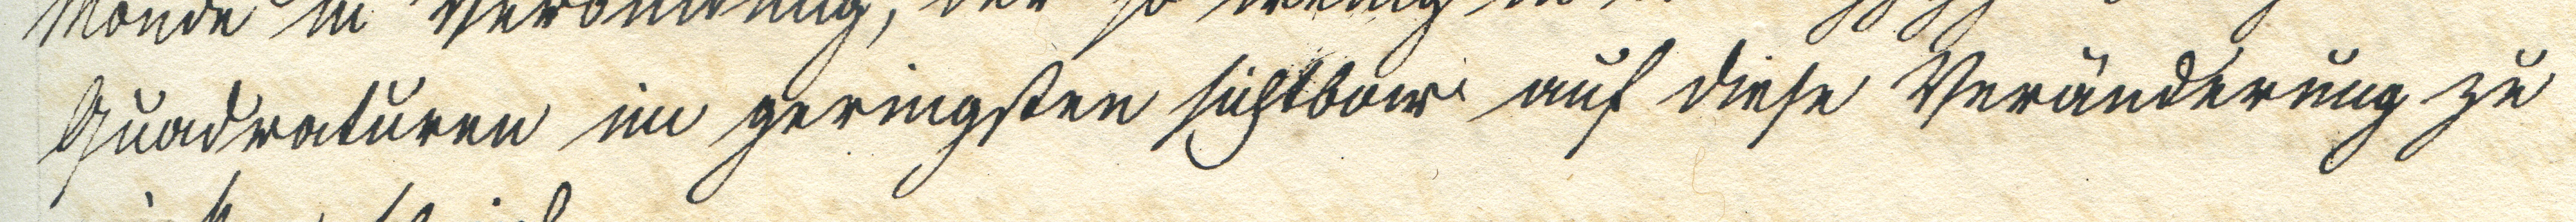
Quadraturen im geringsten sichtbar auf diese Veränderung zu
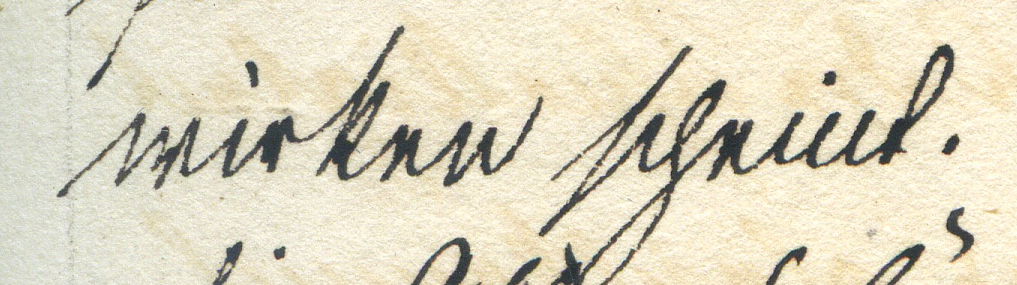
wirken scheint.
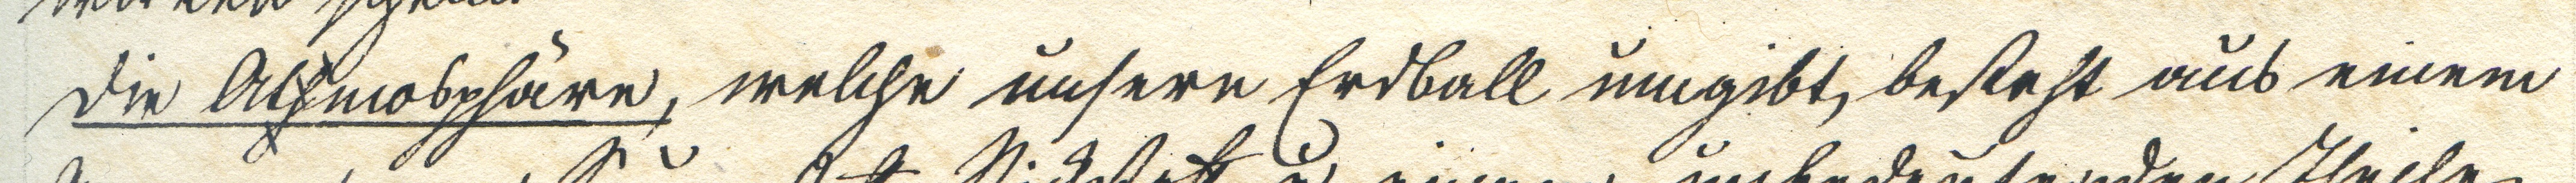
Die Athmosphäre, welche unsern Erdball umgibt, besteht aus einem
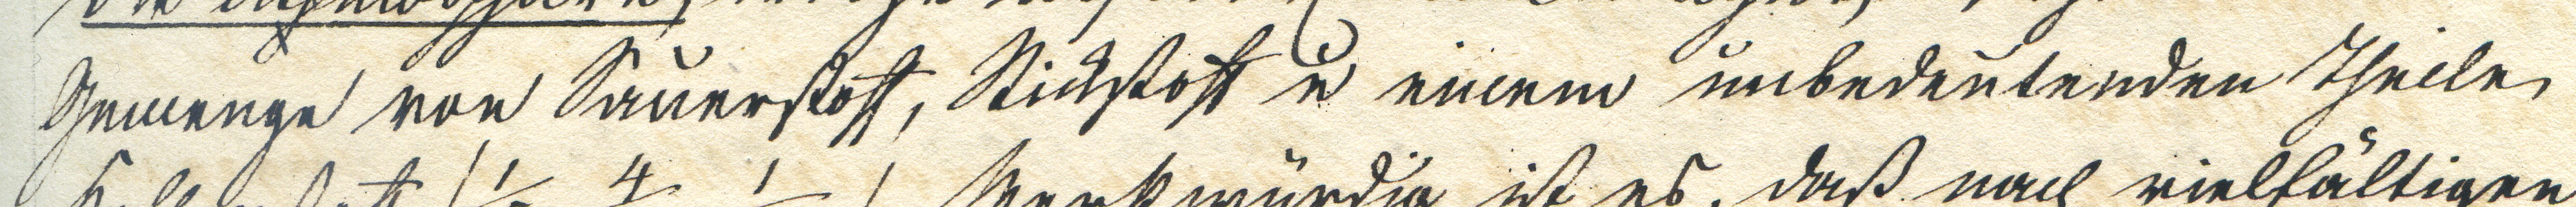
Gemenge von Sauerstoff, Stickstoff u einem unbedeutenden Theile
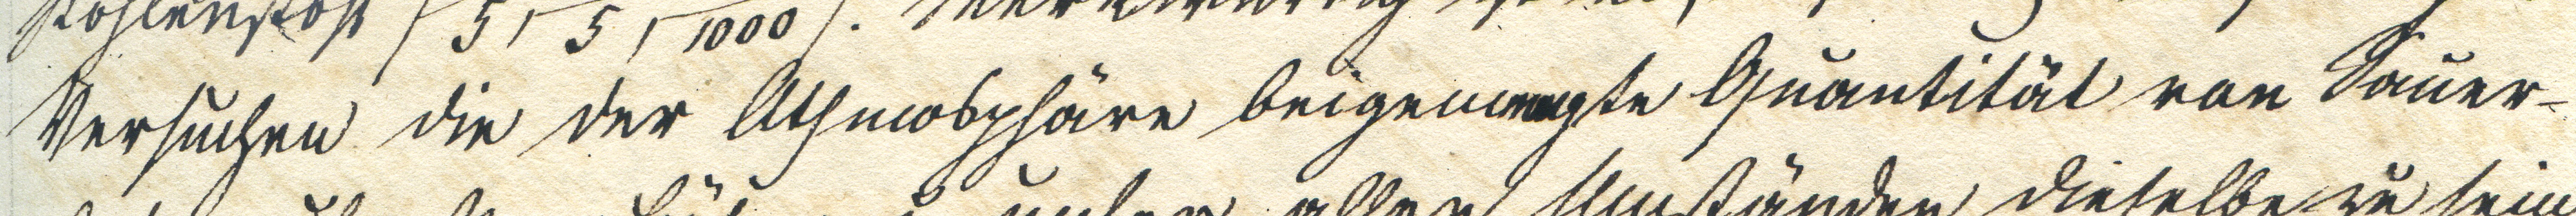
Versuchen die der Athmosphäre beigemengte Quantität von Sauer-
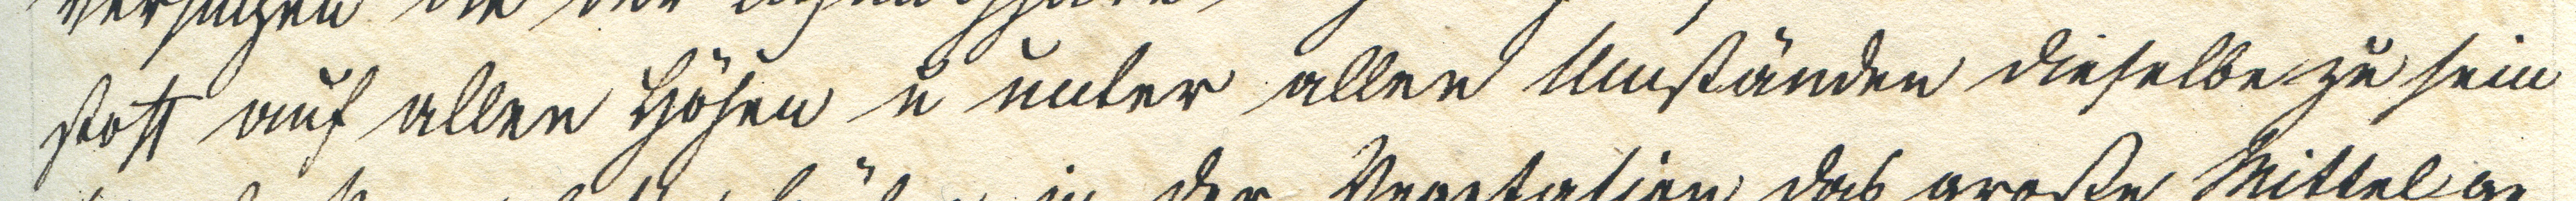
stoff auf allen Höhen u unter allen Umständen dieselbe zu sein
